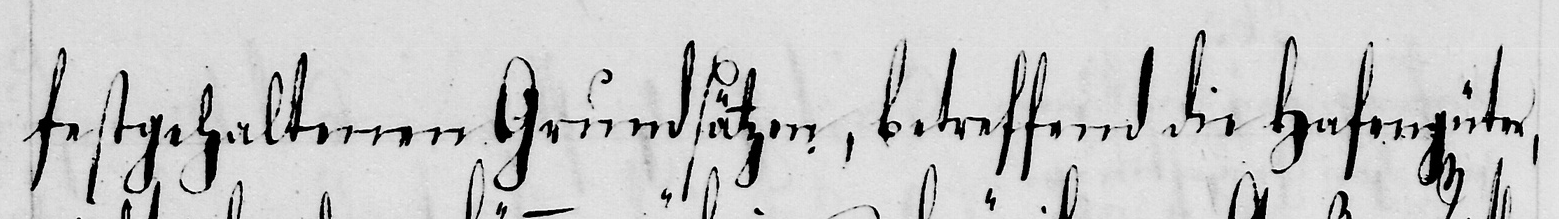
festgehaltenen Grundsätzen, betreffend die Hafengüt¬
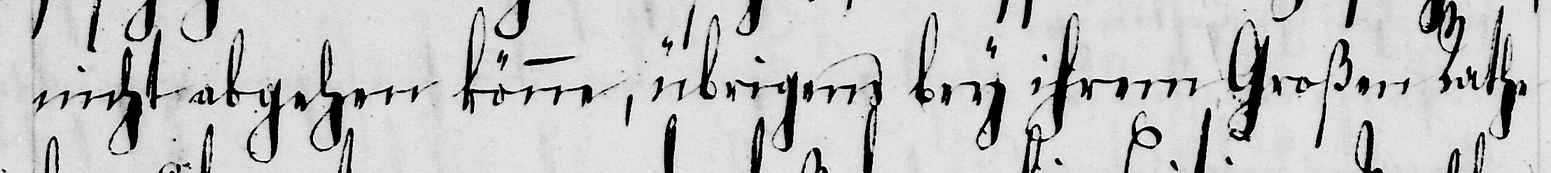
nicht abgehen könne, übrigens bey ihrem Großen Rathe
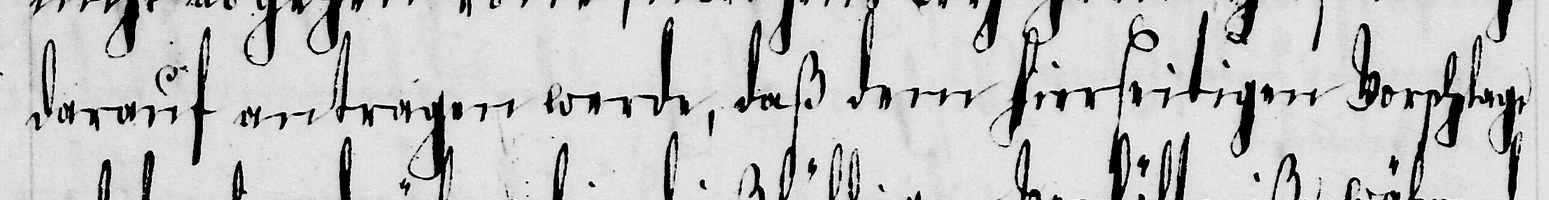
darauf antragen werde, daß dem hierseitigen Vorschlage
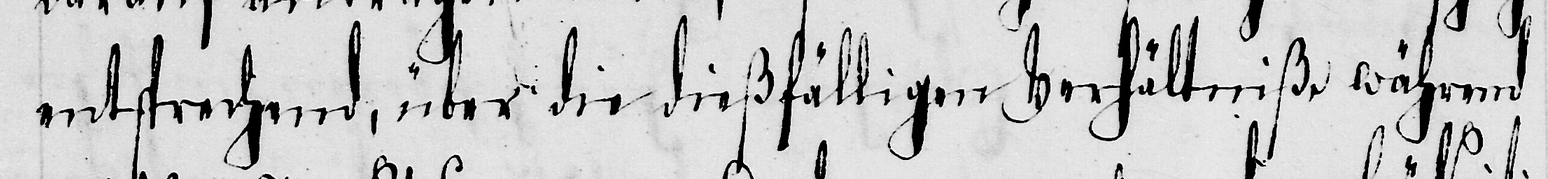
entsprechend, über die dießfälligen Verhältniße während
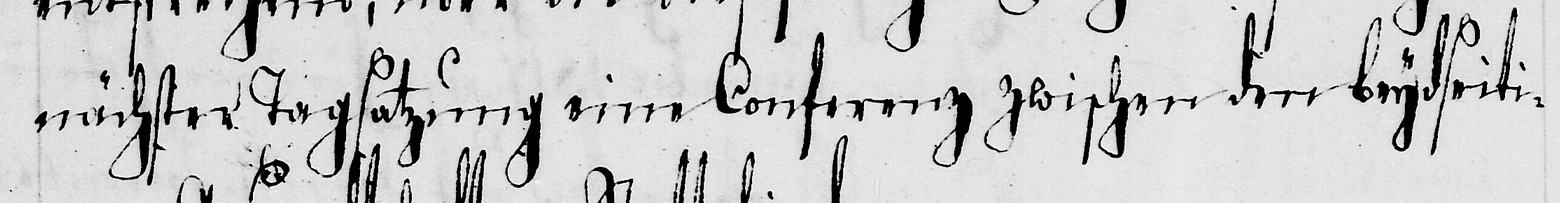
nächster Tagsatzung eine Conferenz zwischen den beydseiti¬
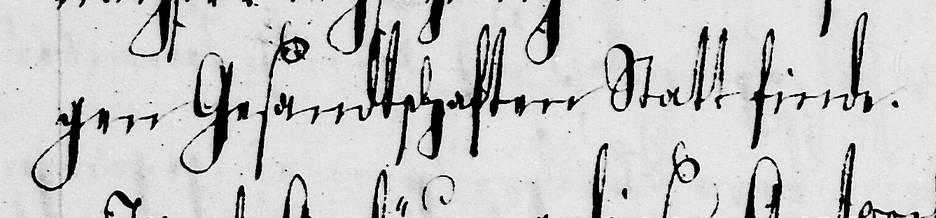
gen Gesandtschaften Statt finde.
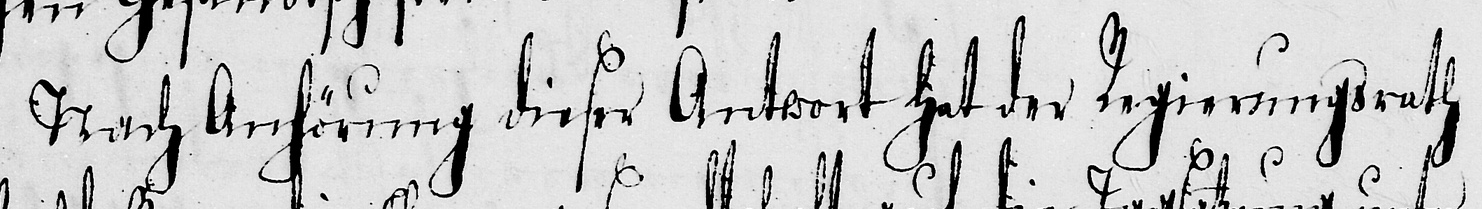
Nach Anhörung dieser Antwort hat der Regierungsrath
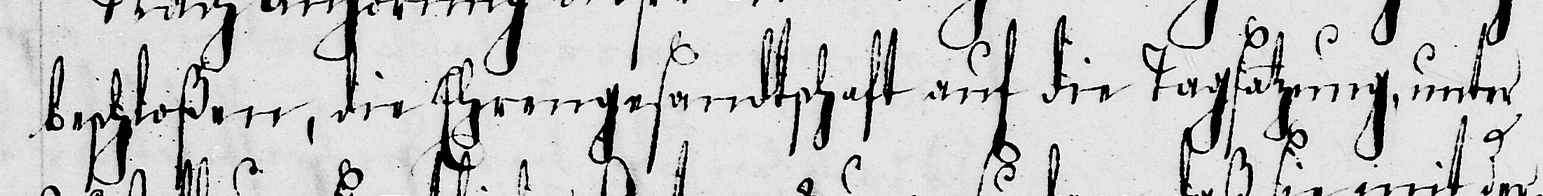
beschloßen, die Ehrengesandtschaft auf die Tagsatzung, unter
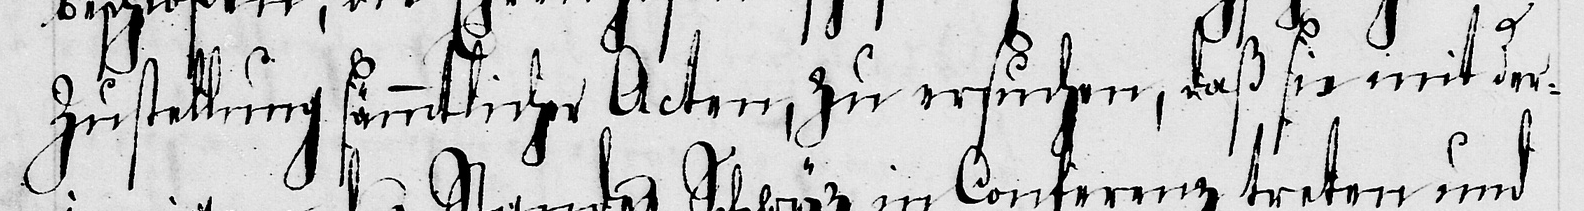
Zustellung sämmtlicher Acten, zu ersuchen, daß sie mit der¬
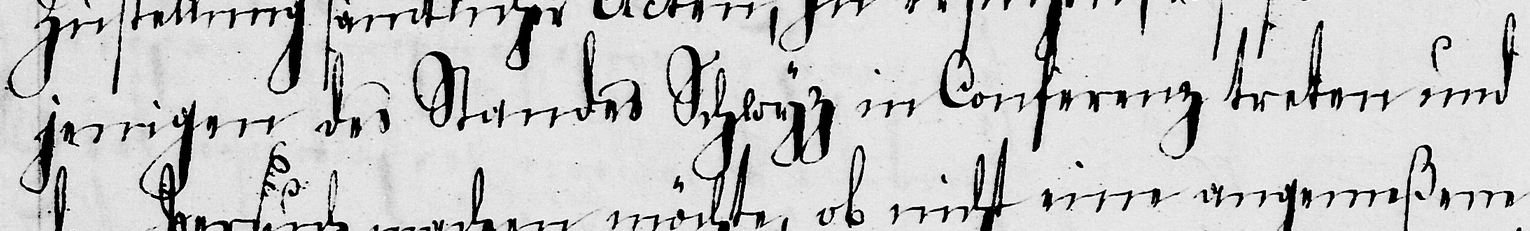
jenigen des Standes Schwyz in Conferenz treten und
